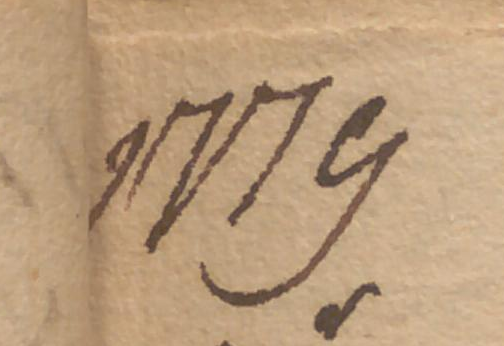1779
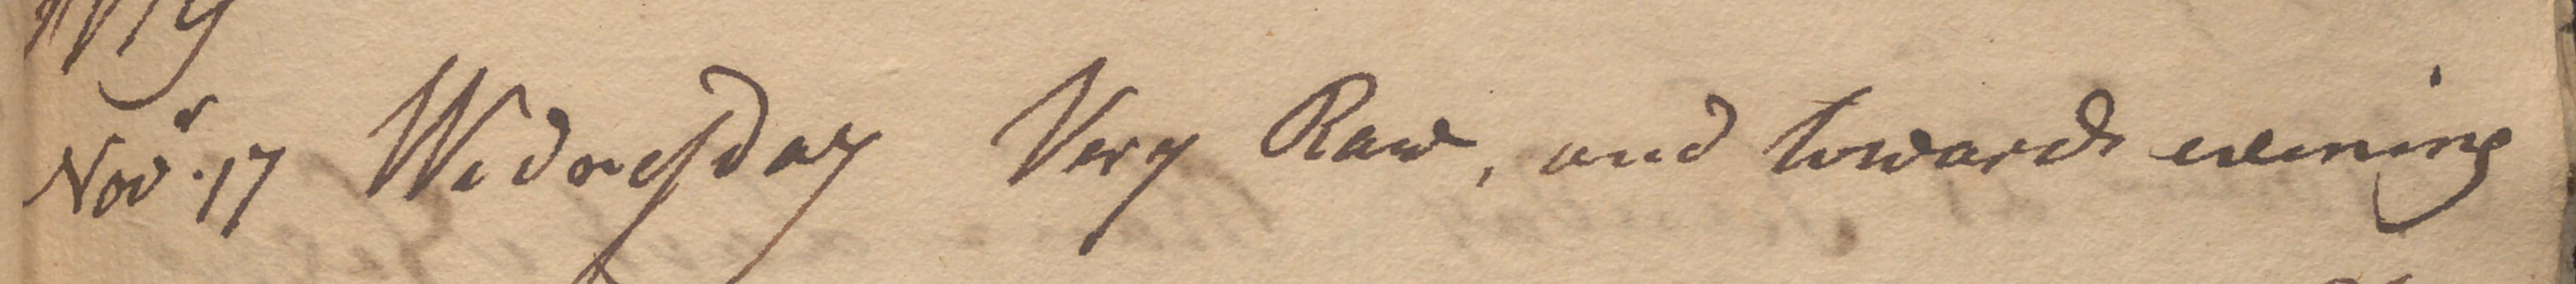Nov^r. 17 Wednesday Very Raw, and towards evening
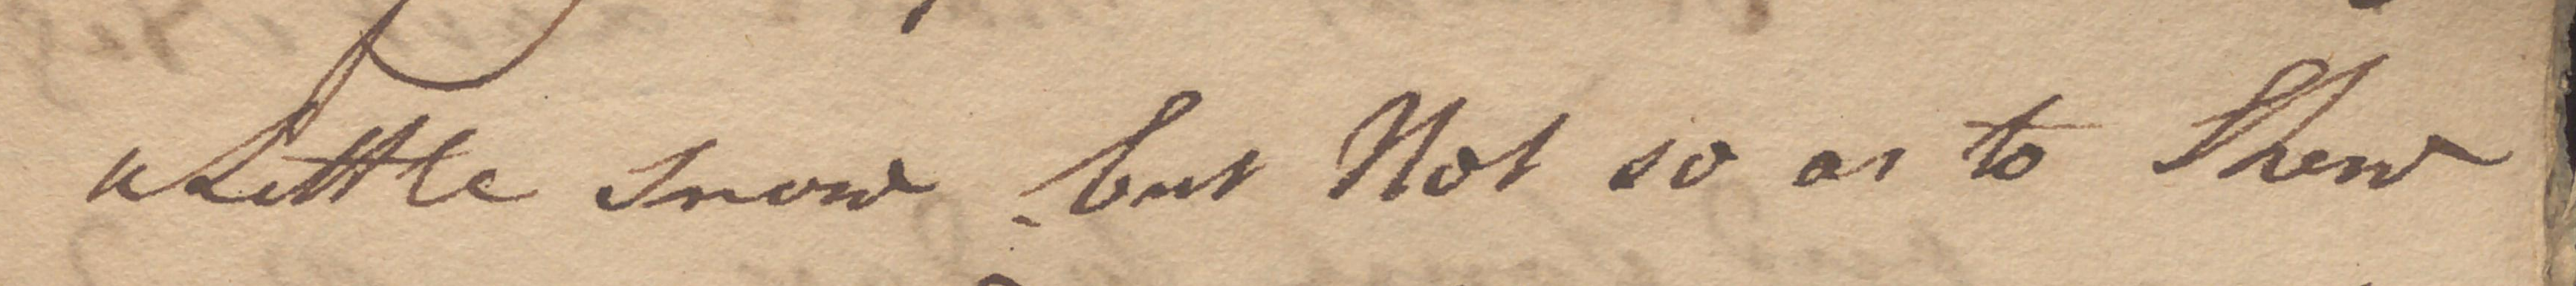a Little snow but Not so as to shew
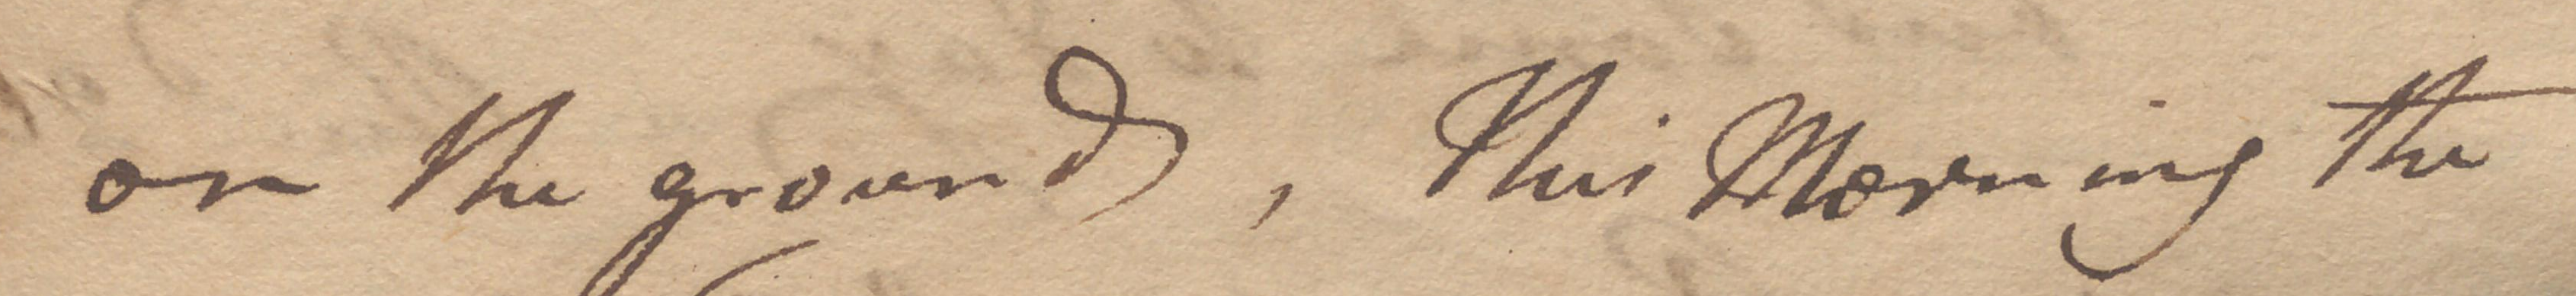on the ground, This Morning the
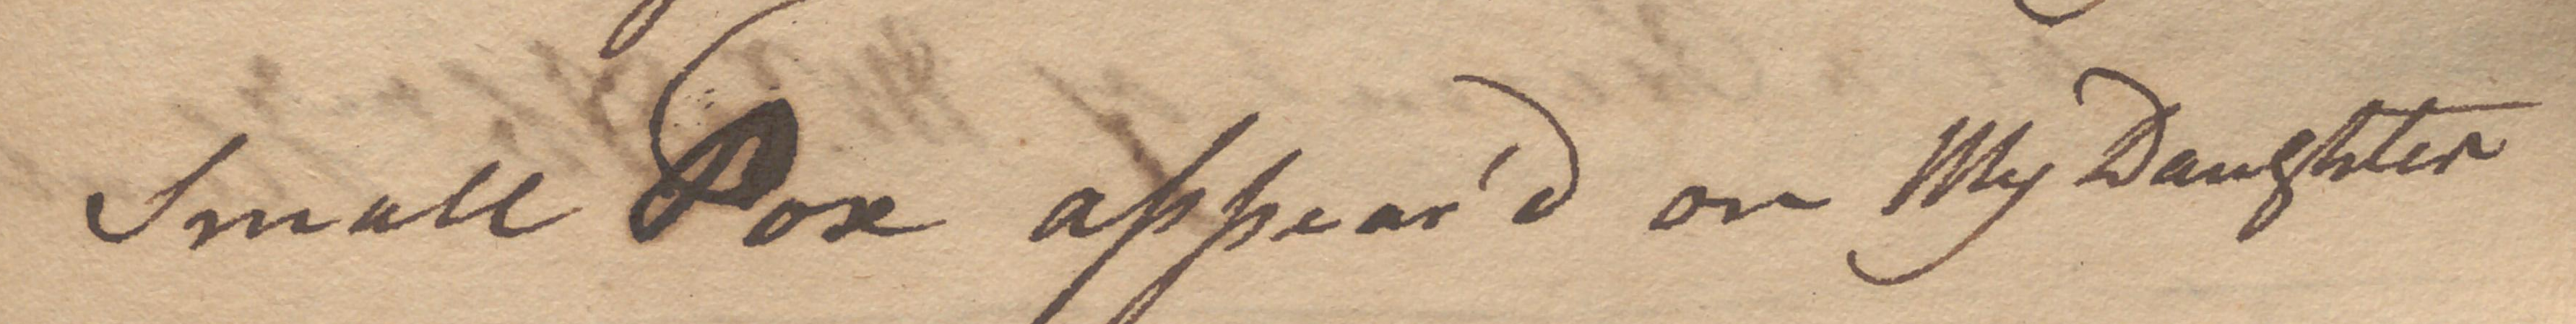small Pox appear'd on My Daughter
